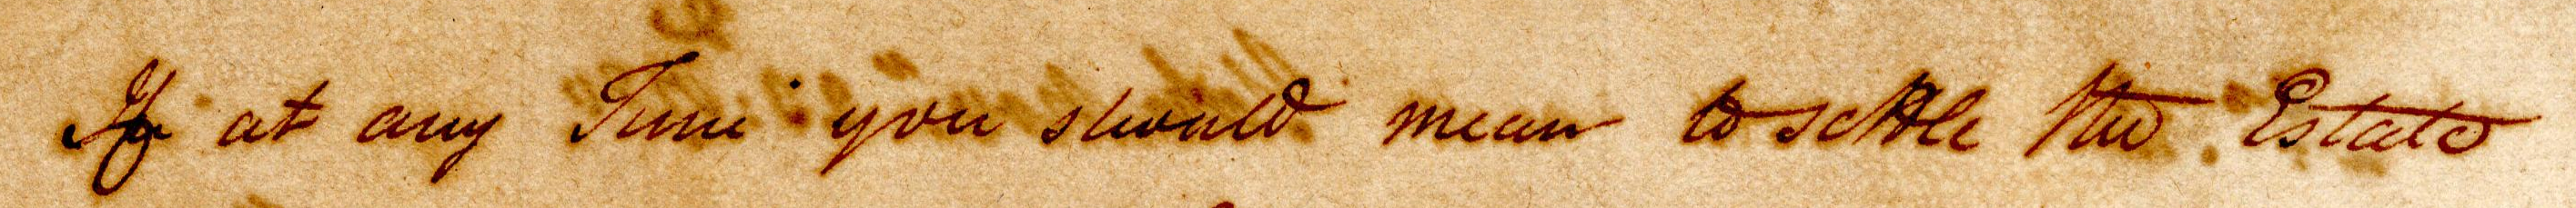If at any Time you should mean to settle the Estate
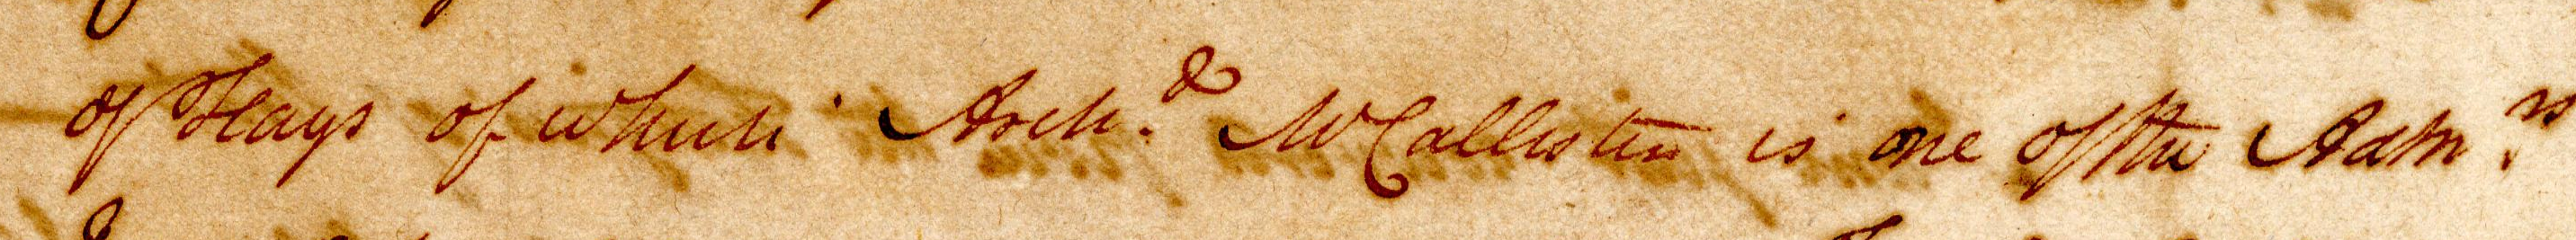of Hays of which Arch^d. M^cCallister is one of the Aam^rs
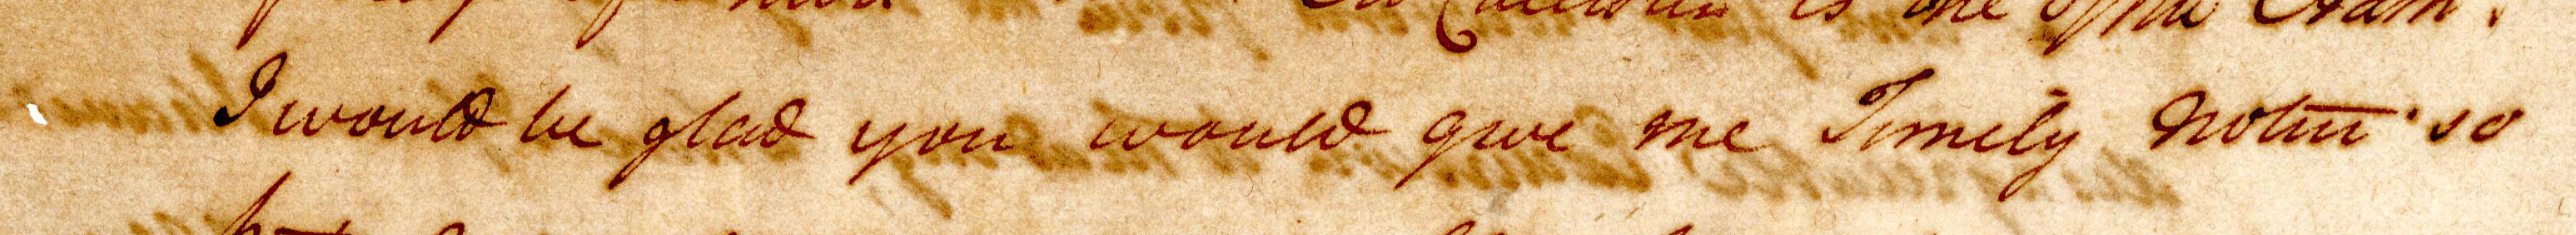I would be glad you would give me Timely Notice so
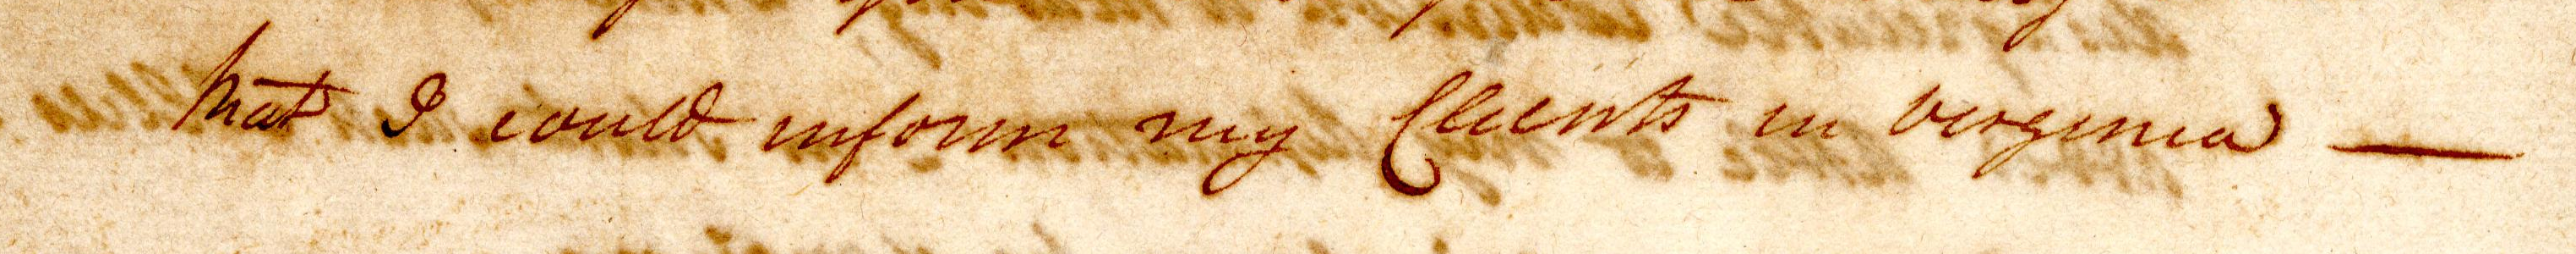that I could inform my Clients in Virginia.
